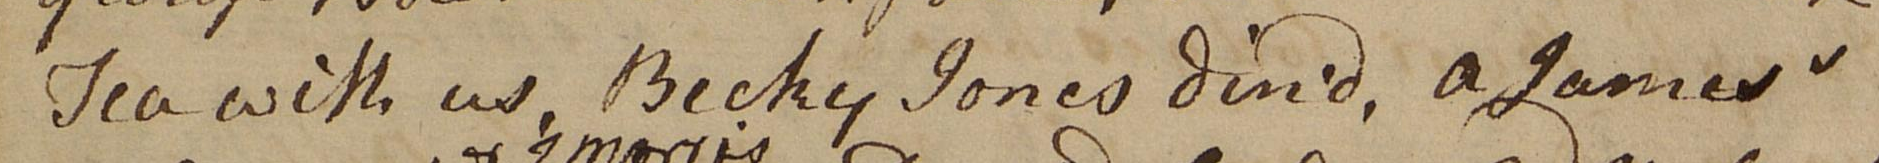Tea with us, Becky J ones din'd, A James^s
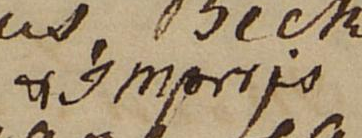& J Morris
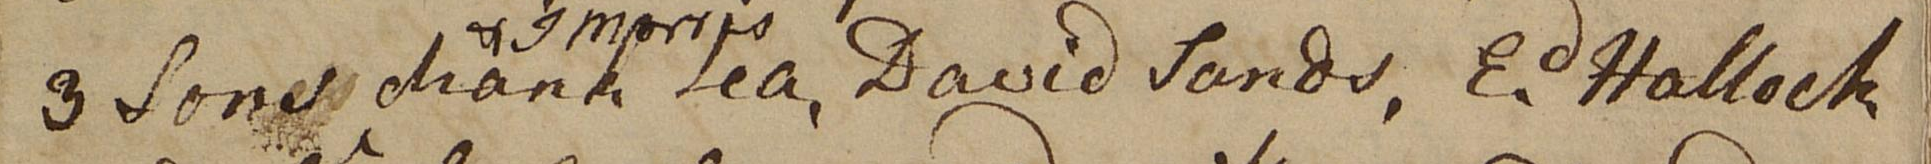3 Sons drank tea, David Sands, E^d Hallock
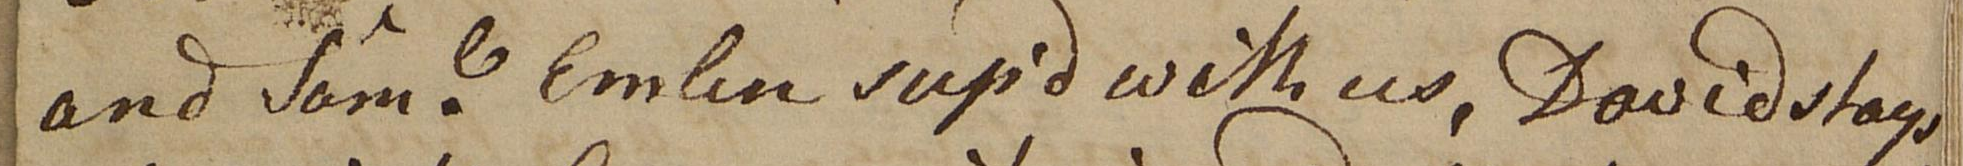and Sam.^l Emlen sup'd with us, David stays
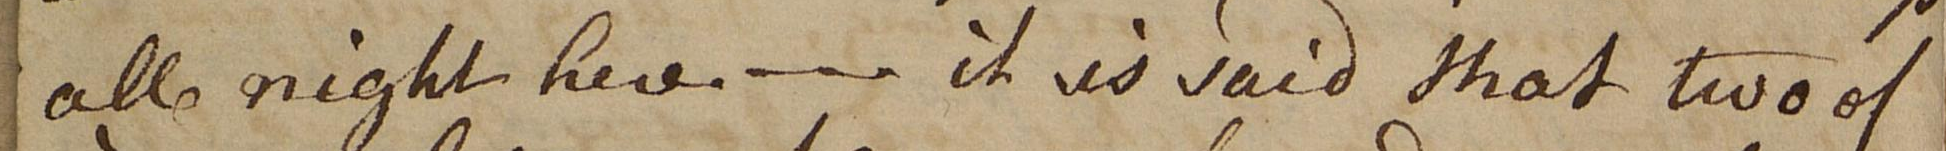all night here.- it is said that two of
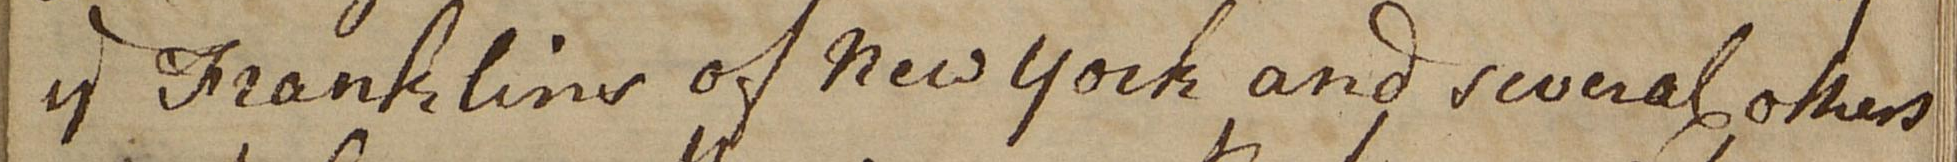y^e Franklins of New York and several others
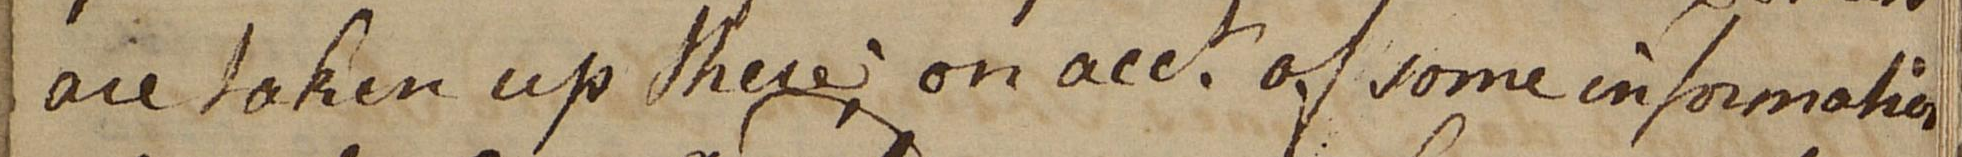are taken up these on acc^t. of some information
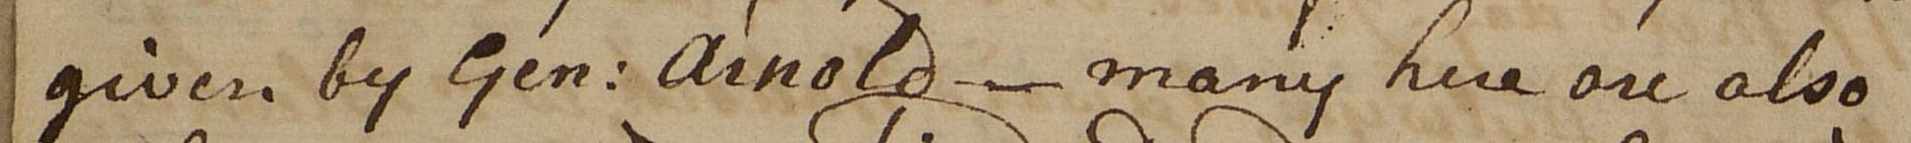given by Gen: Arnold-- many here are also
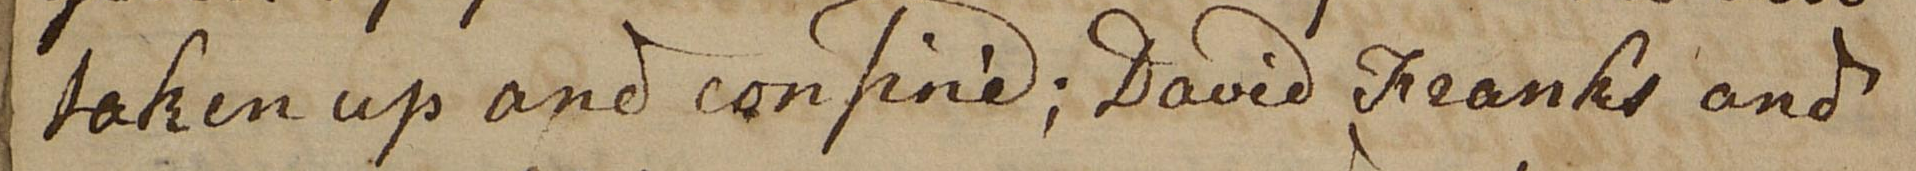taken up and confin'd; David Frank's and
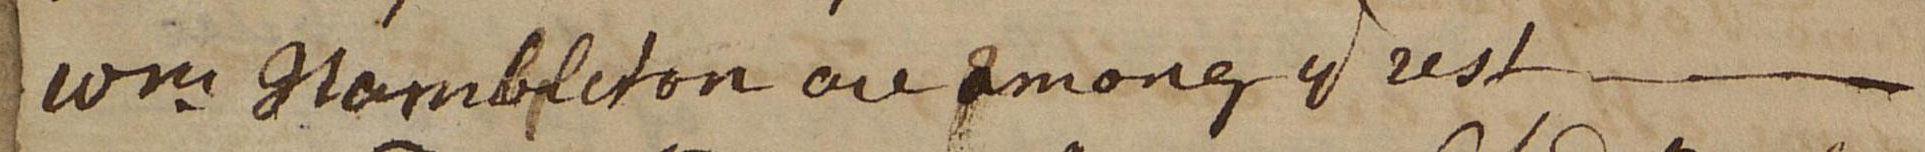W^m Hambleton are among y^e rest-
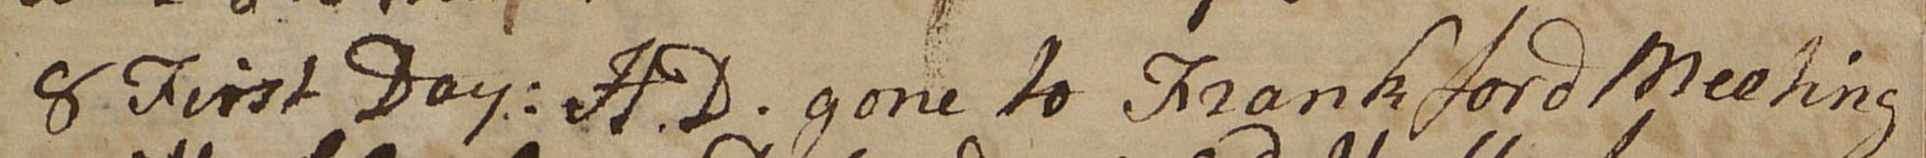8 First Day: HD gone to Frankford Meeting
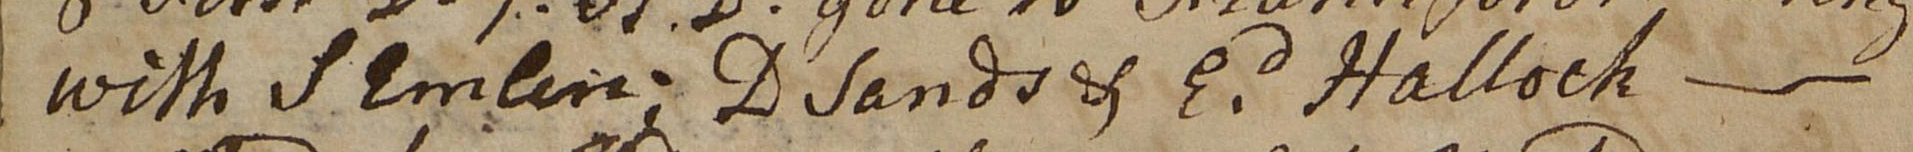with S Emlen; D Sands & E^d Hallock-
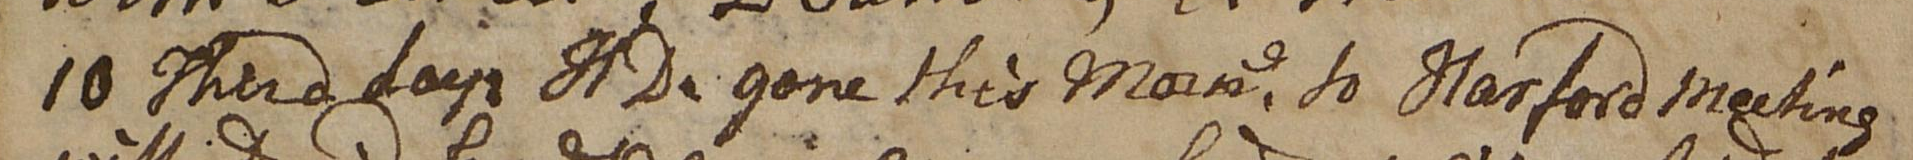10 Third days HD. gone this Morn^g. to Harford meeting
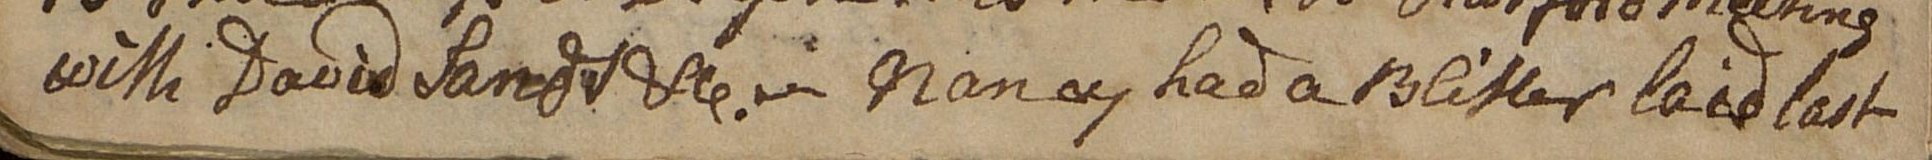with David Sands &c- Nancy had a Blister laid last
